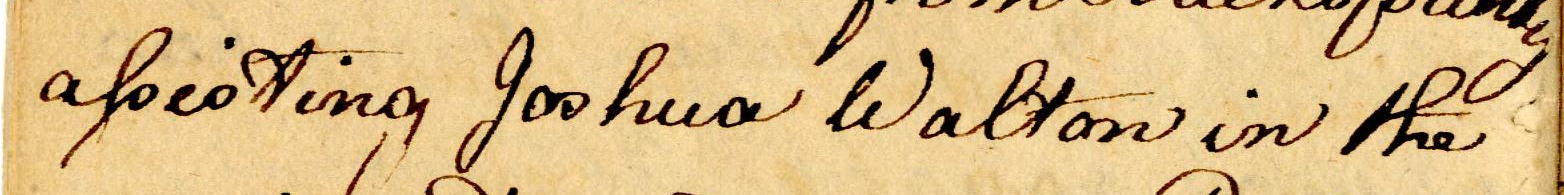assisting Joshua Walton in the
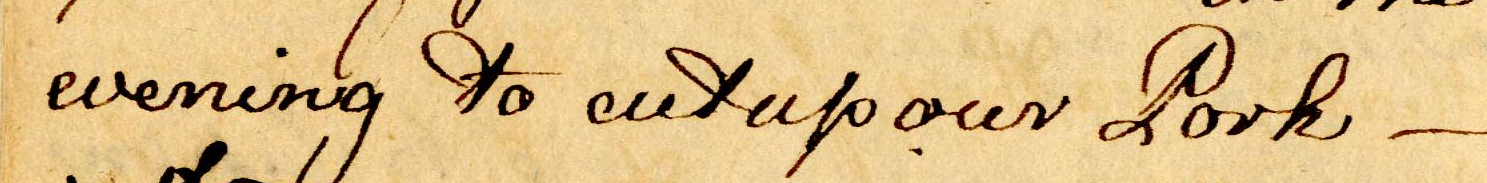evening to cut up our Pork-
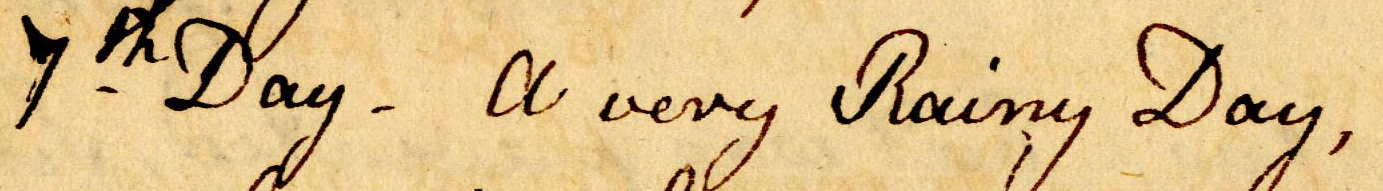7^th Day- A very Rainy Day,
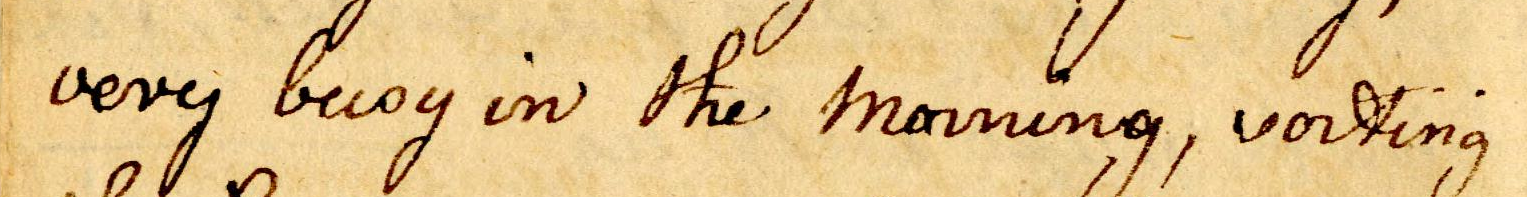very busy in the Morning, sorting
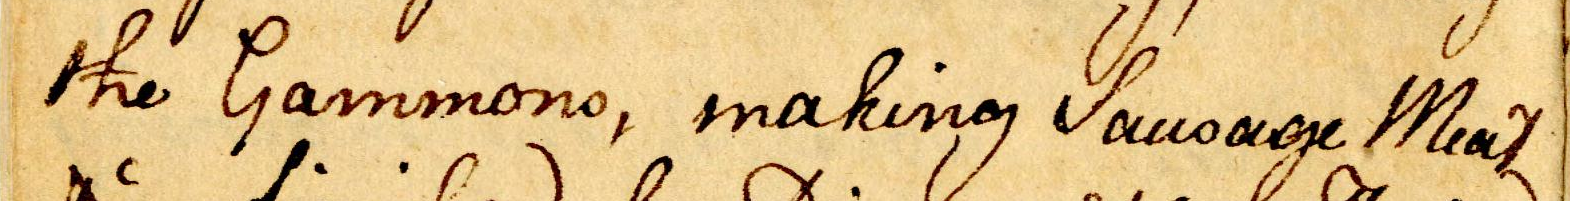the Gammons, making Sausage Meat
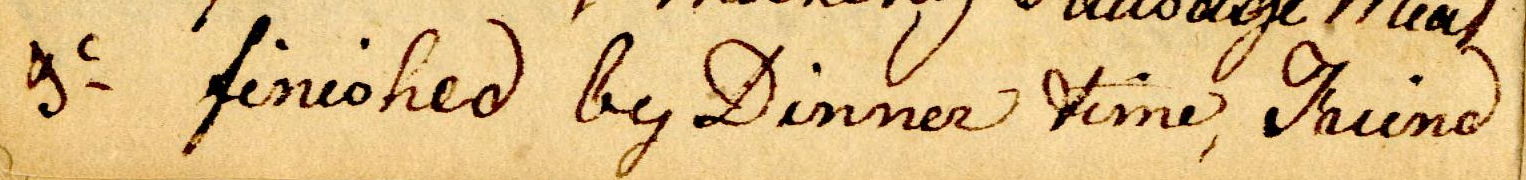&^c- finished by Dinner time, Friend
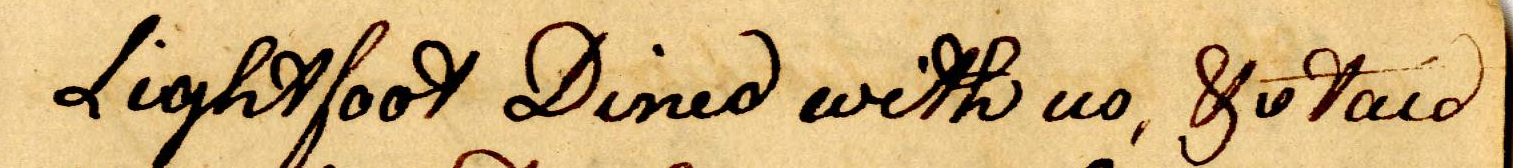Lightfoot Dined with us, & staid
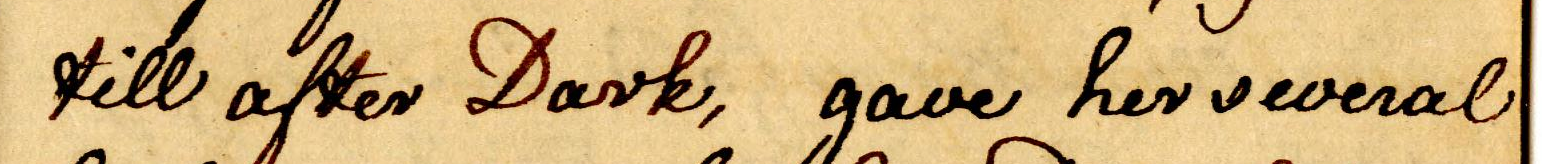till after Dark, gave her several
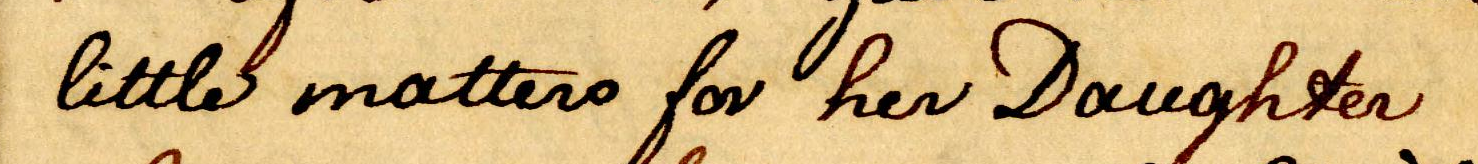little matters for her Daughter
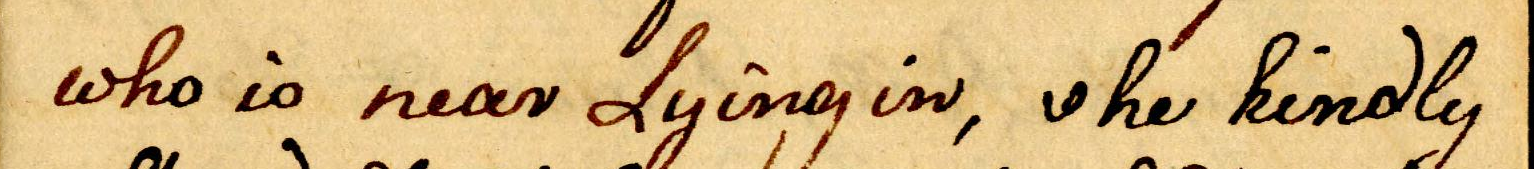who is near Lying in, she kindly
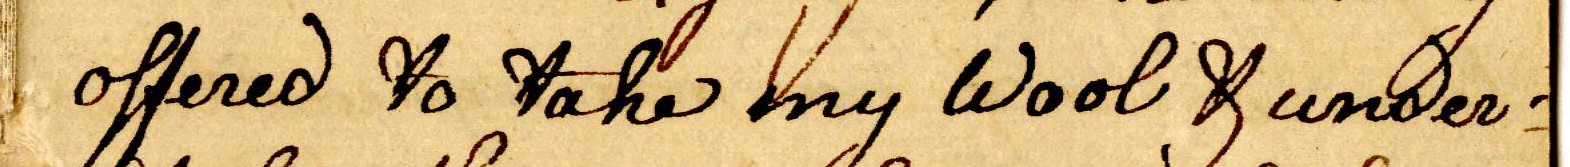oftered to take my Wool & under-
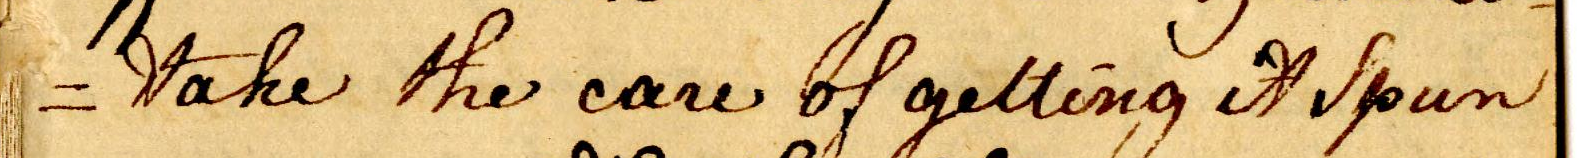-take the care of getting it Spun
